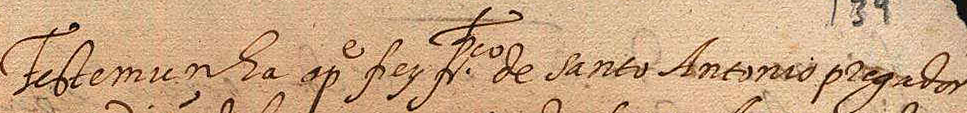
Testemunha o pe frey fr.co de santo Antonio pregador
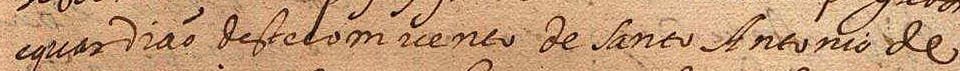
e guardiaõ deste comuento de Santo Antonio de
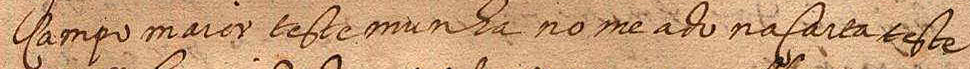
Campo maior testemunha nomeado na Carta teste
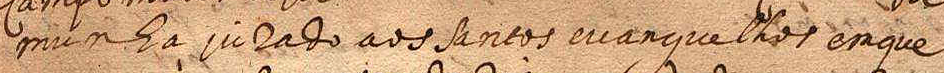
munha jurado aos santos euanguelhos em que
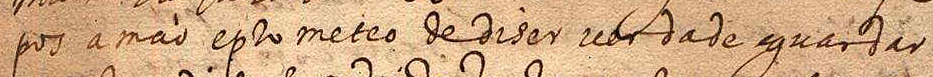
pos a mão e prometeo de diser uerdade e guardar
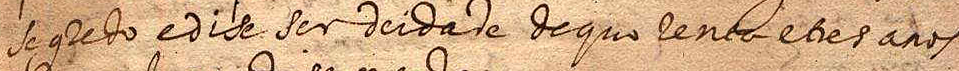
segredo e dise ser de idade de quorenta e tres anos
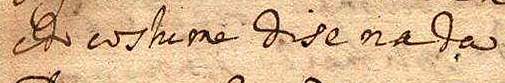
e do costume dise nada
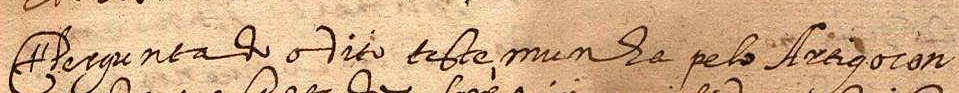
Perguntado o dito testemunha pelo Artigo con
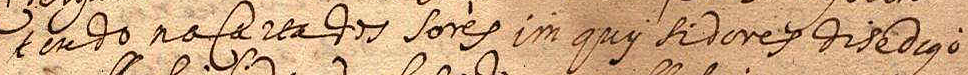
teudo na Carta dos sorēs imquysidores dise digo
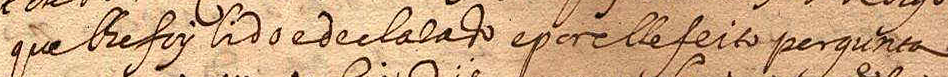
que lhe foy lido e declarado e por elle feito pergunta
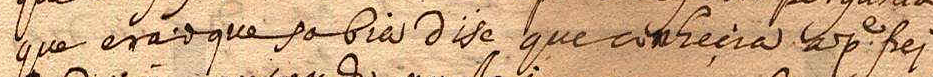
que era o que sabia dise que conhecia ao p.e frej
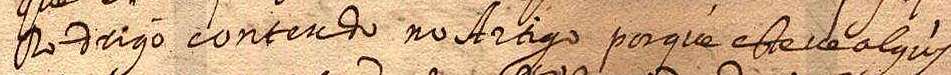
Rodrigo conteudo no Artigo porque esteue algūs
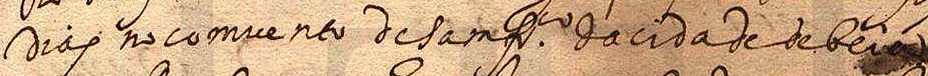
dias no comuento de sam fr.co da cidade de beia
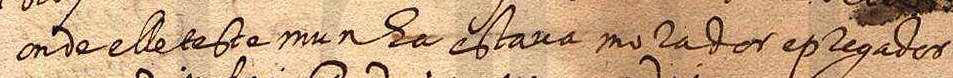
onde elle testemunha estaua morador e pregador
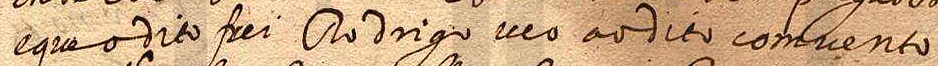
e que o dito frei Rodrigo ueo ao dito conuento
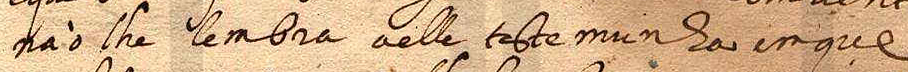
naõ lhe lembra a elle testemunha em que
